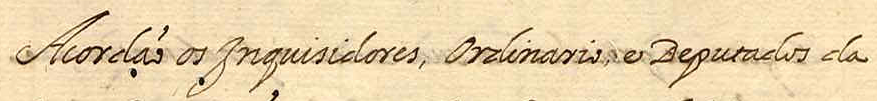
Acordaõ os Jnquisidores, Ordinario, e Deputados da
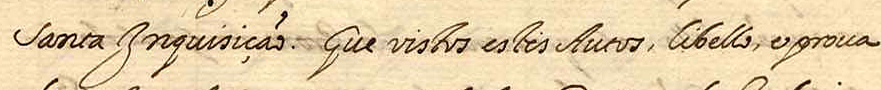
Santa Jnquisiçaõ. Que vistos estes Autos, libello, e proua
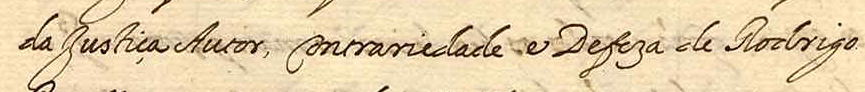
da Justiça Autor, Contrariedade e Defeza de Rodrigo
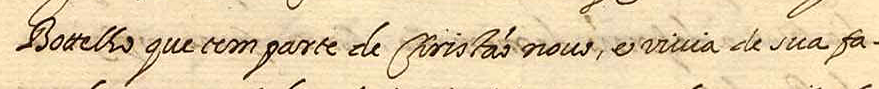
Bottelho que tem parte de Christaõ nouo, e viuia de sua fa
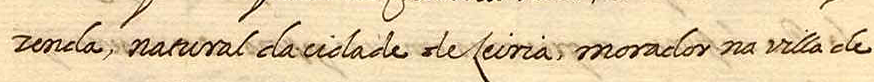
zenda, natural da cidade de Leiria, morador na villa de
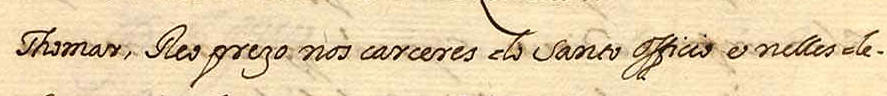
Thomar, Reo prezo nos carceres do Santo officio e nelles de
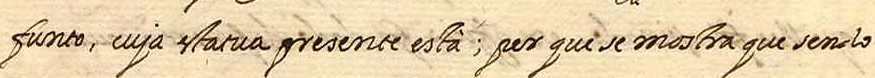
funto, cuja estatua presente está; per que se mostra que sendo
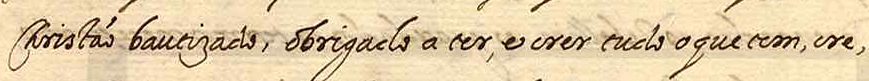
Christaõ bautizado, obrigado a ter, e crer tudo o que tem, cre,
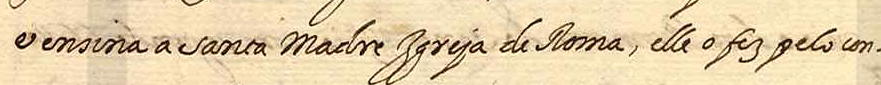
e ensina a santa madre Jgreja de Roma, elle o fez pelo con
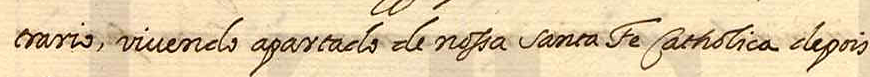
trario, viuendo apartado de nossa santa Fe Catholica depois
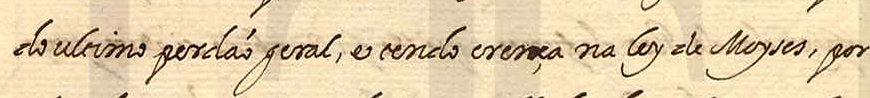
do ultimo perdaõ geral, e tendo crença na ley de Moyses, por
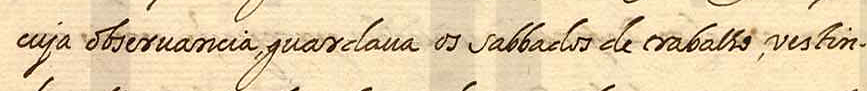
cuja obseruancia, guardaua os sabbados de trabalho, vestin
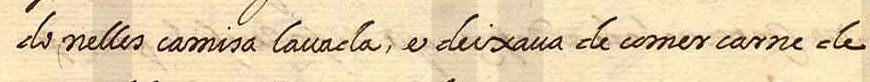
do nelles camisa lauada, e deixaua de comer carne de
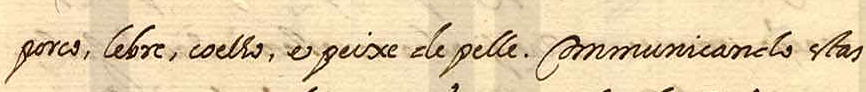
porco, lebre, coelho, e peixe de pelle. Communicando estas
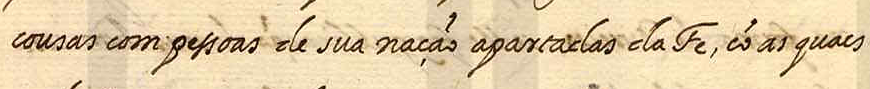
cousas com pessoas de sua naçaõ apartadas da Fe, cō as quaes
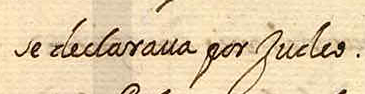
se declaraua por Judeo.
